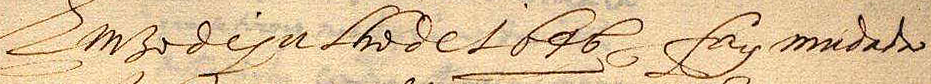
Em 10 de julho de 1646 foy mudada
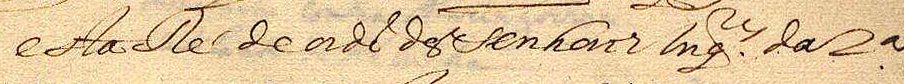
esta Ré de ordē dos Senhores Inq.res da 2a
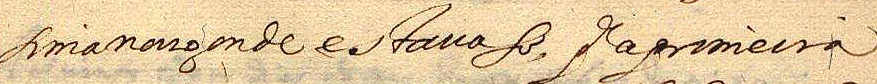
sima nouo, onde estaua so, pa a primeira
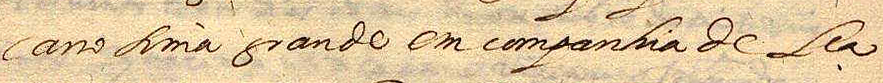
cano sima grande em companhia de Lça
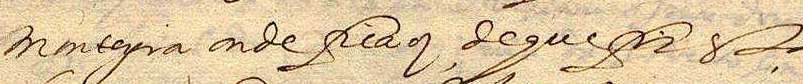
monteyra onde ficaõ, de que fis esta
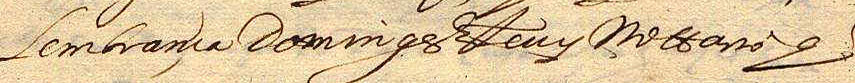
Lembrança Domingos Esteues nottario q̄
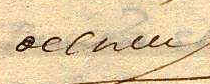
o escreuj
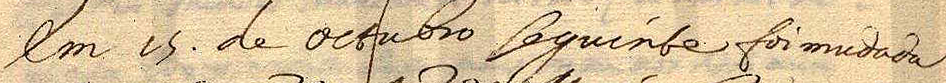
Em 15. de octubro seguinte foi mudada
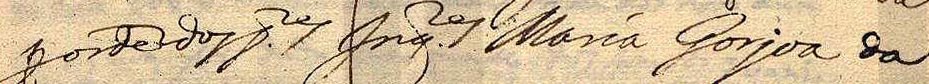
ꝑ ordē dos s.res Jnq.res Maria Gorjoa da
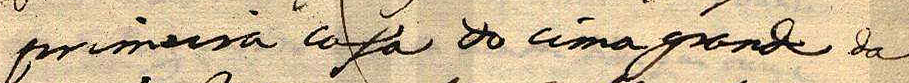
primeira casa do cima grande da
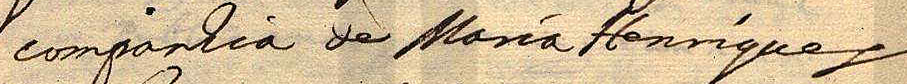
companhia de Maria Henriques
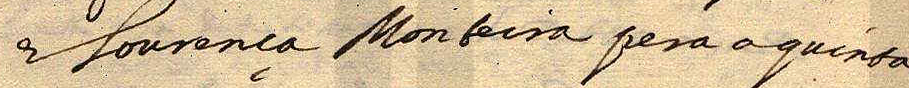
E Lourença Monteira pera a quinta
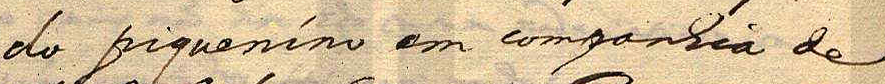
do piquenino em companhia de
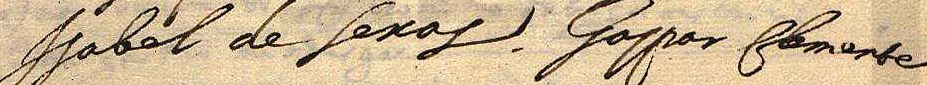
Jsabel de Sexas Gaspar Clemente
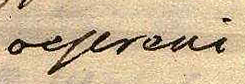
o escreui
